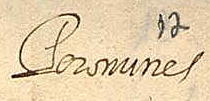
Pero nunes
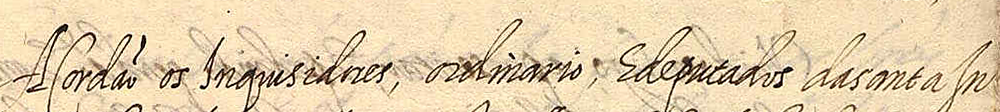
ACordaõ os Inquisidores, ordinario, E deputados da santa Jn
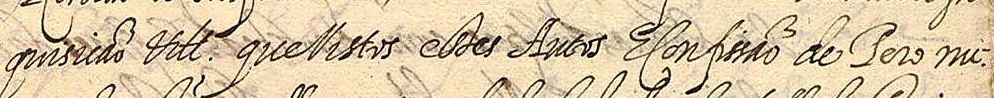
quisiçaõ &tt. que Vistos estes Autos E Confissão de Pero nu
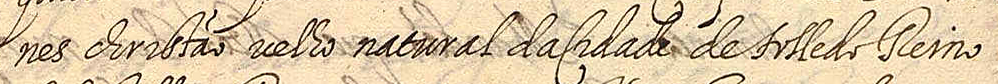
nes christaõ uelho natural da Cidade de tolledo Reino
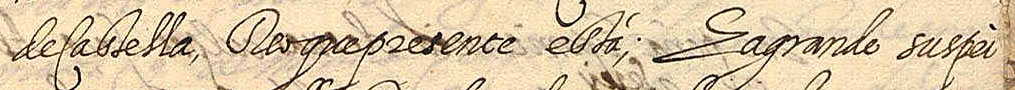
de Castella, Reo que presente está; E a grande suspei
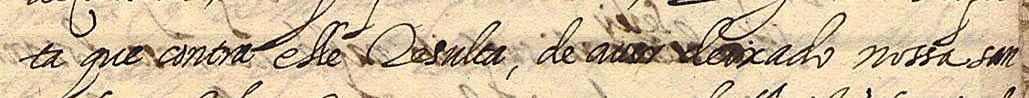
ta que contra elle Resulta, de auer deixado nossa san
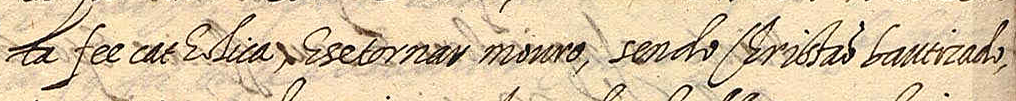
ta fee catholica, E se tornar mouro, sendo Christaõ bautizado,
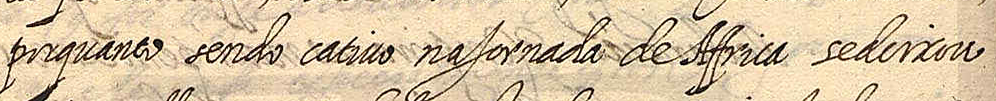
porquanto sendo catiuo na Jornada de Affrica se deixou
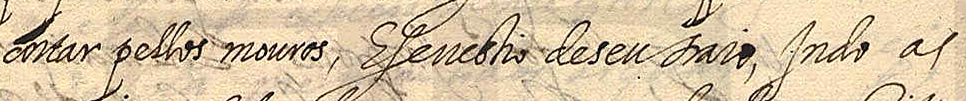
cortar pellos mouros, E se uestio de seu traio, Jndo as
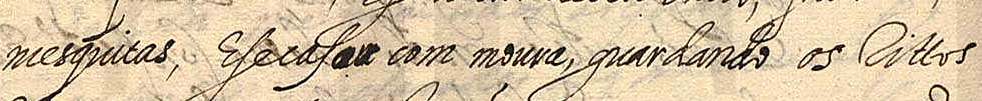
mesquitas, E se casou com moura, guardando os Rittos
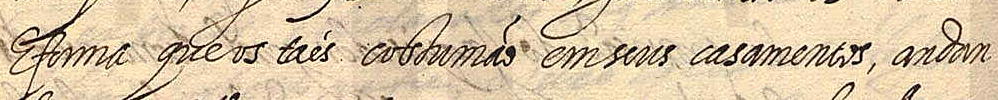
E forma que os taes costumaõ em seus casamentos, andan
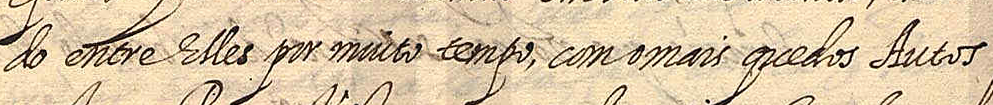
do entre Elles por muito tempo, com o mais que dos Autos
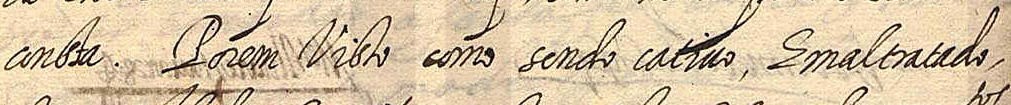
consta. Porem Visto como sendo catiuo, E maltratado,
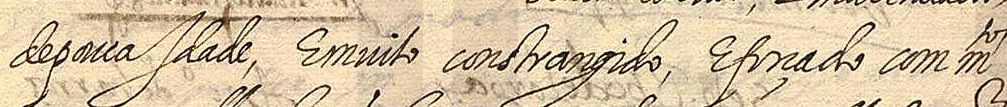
de pouca Jdade, E muito constrangido, E forçado com mtos
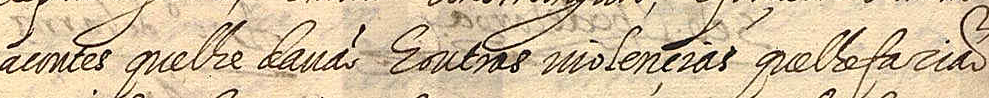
açoutes que lhe dauaõ E outras uiolencias que lhe faziaõ
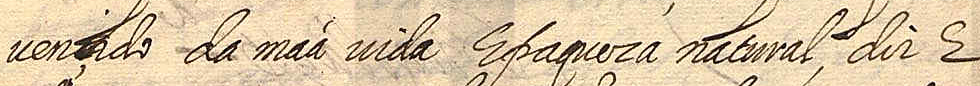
uencido da maá uida E fraqueza natural, diz E
